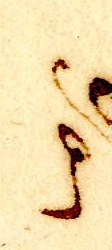To
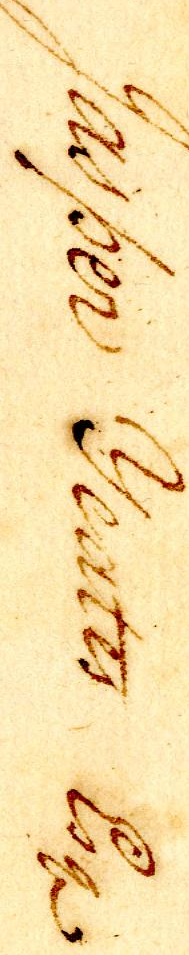Jasper Yeates Esq
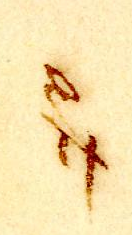at
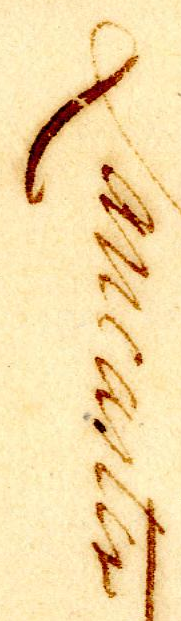Lancaster
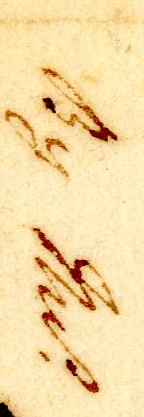By M^r
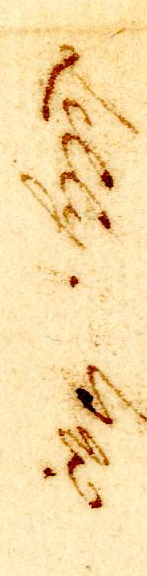Lilly Esq.
